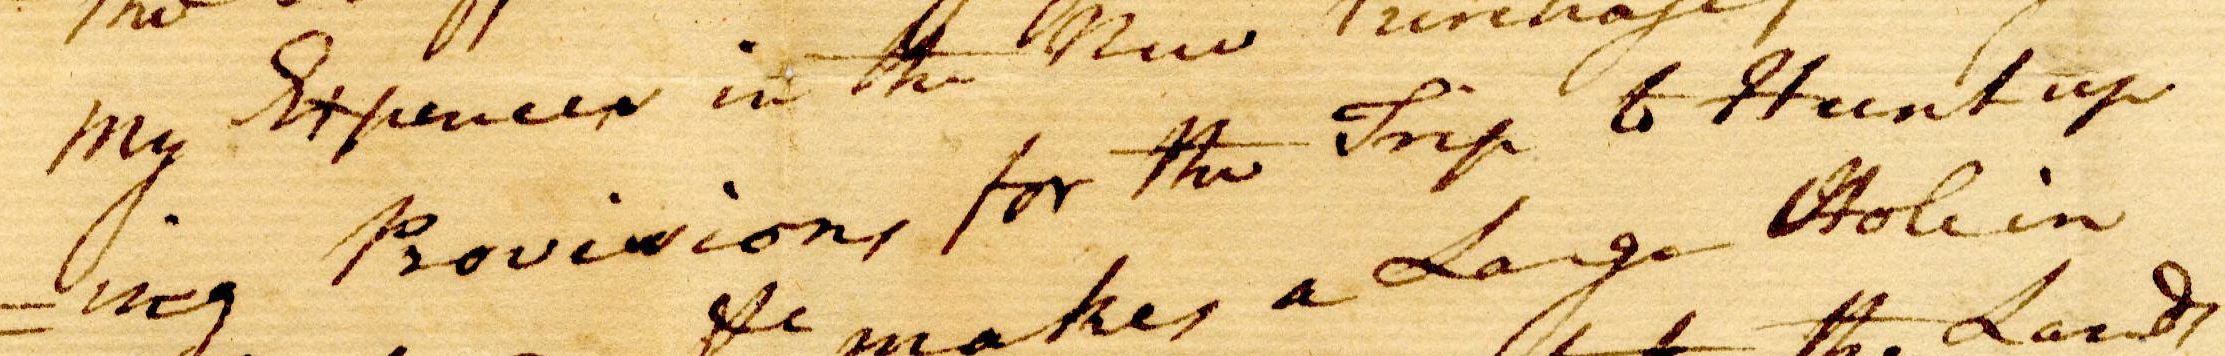-ing Provisions for the Trip to Hunt up
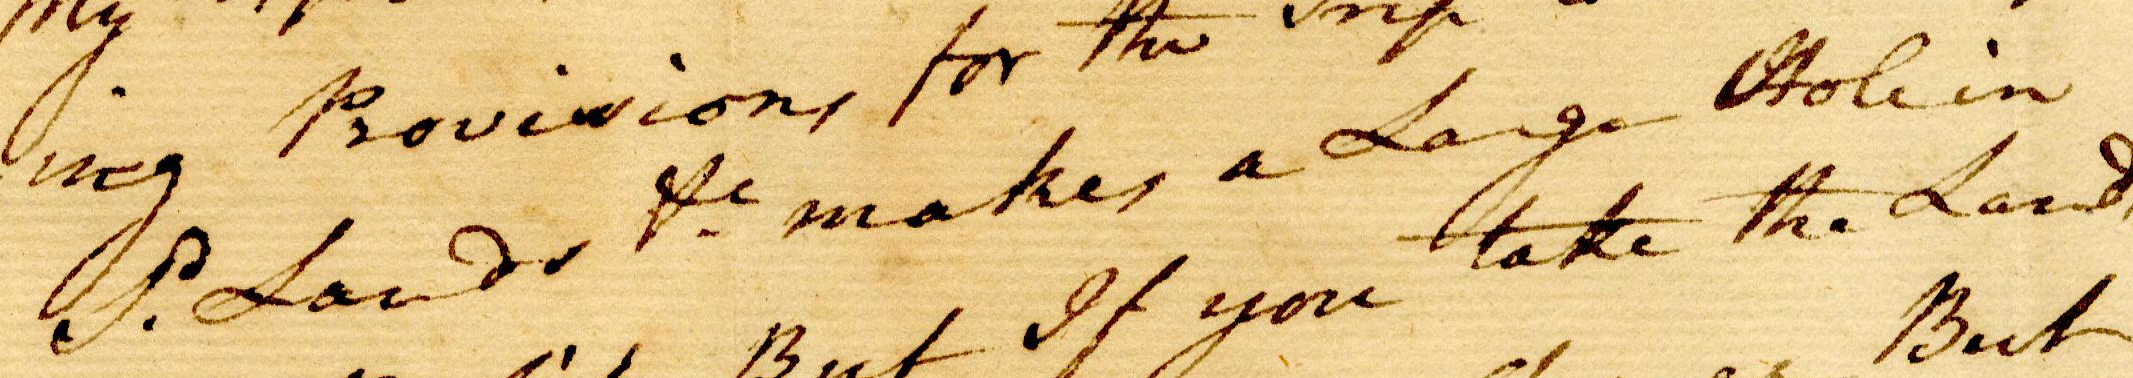S^d. Lands &^c. makes a Large Hole in
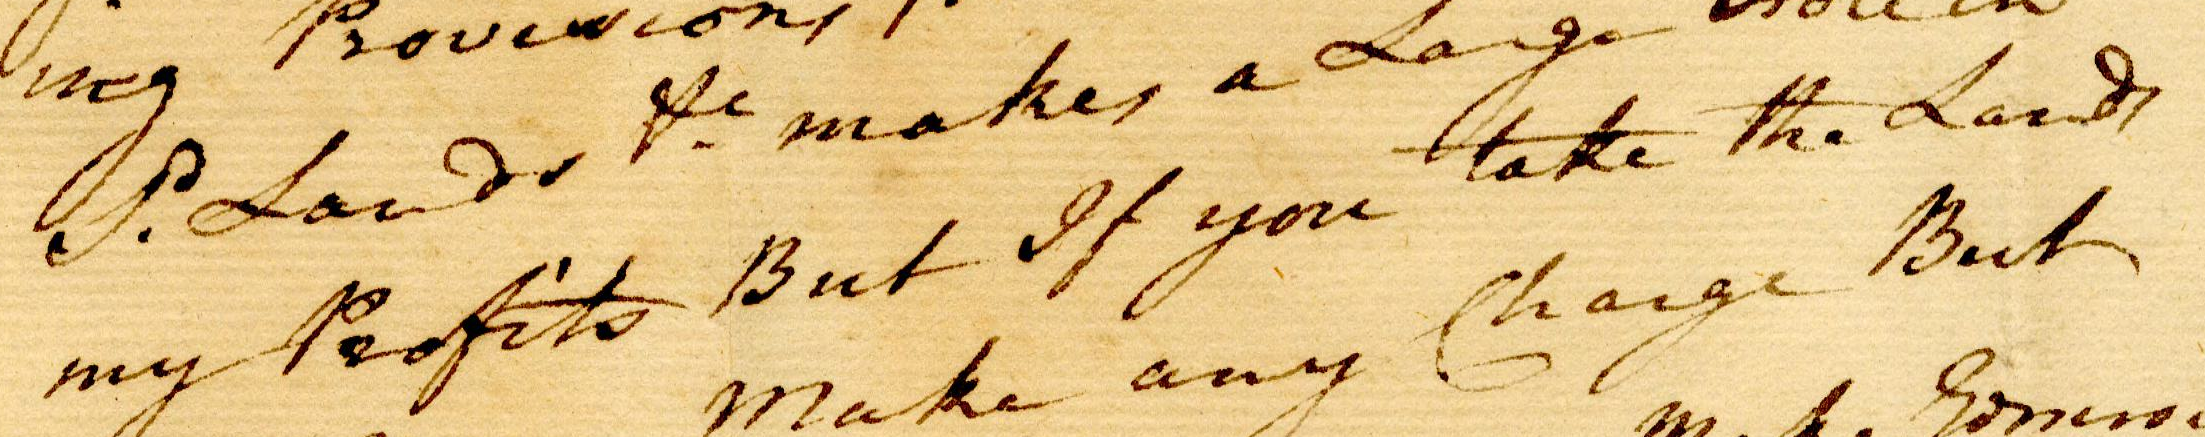my Profits But If you take the Land
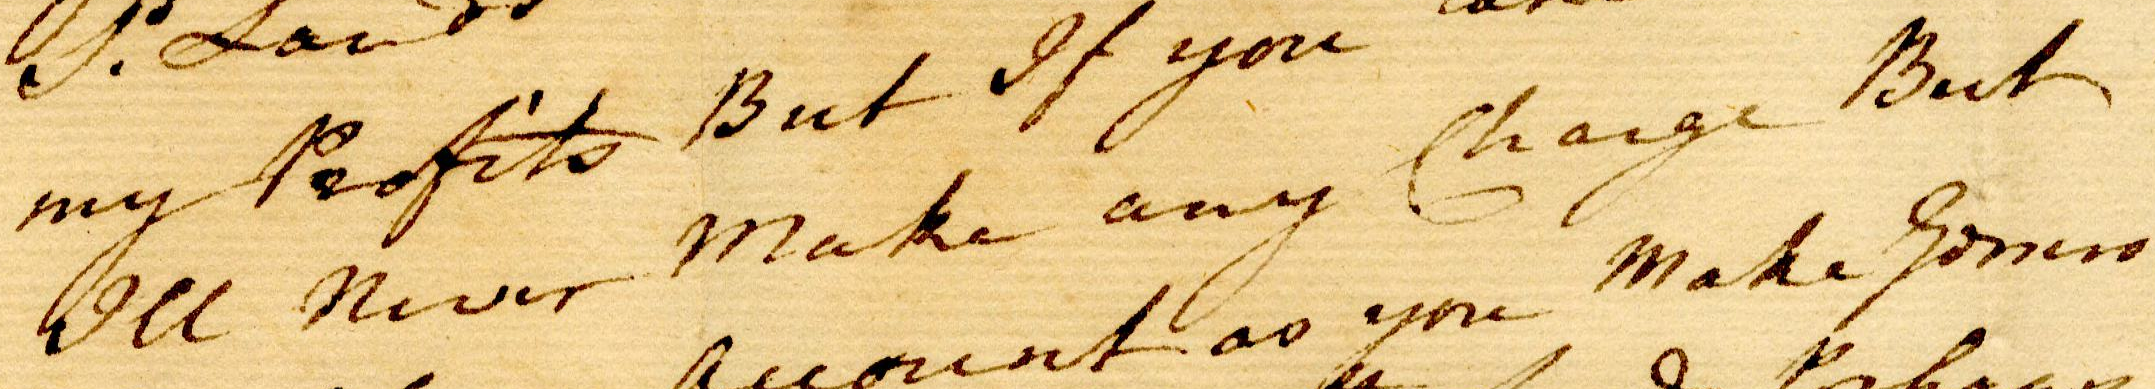Ill Never Make any Charge But
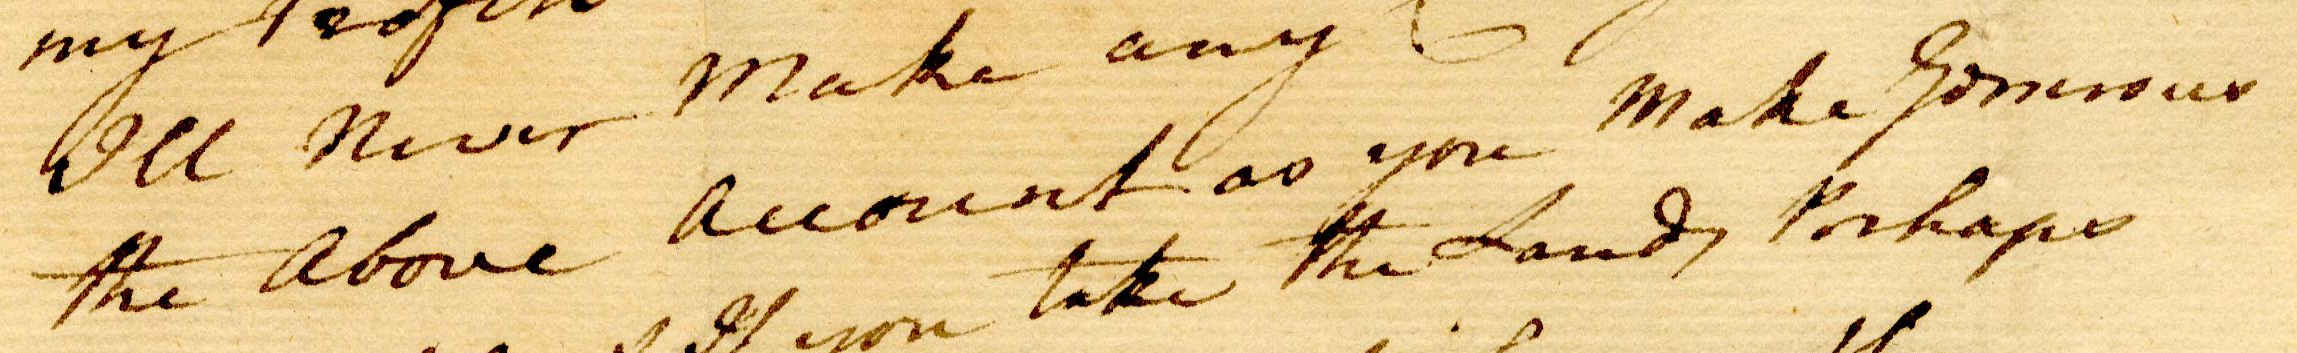the above account as you make Generous
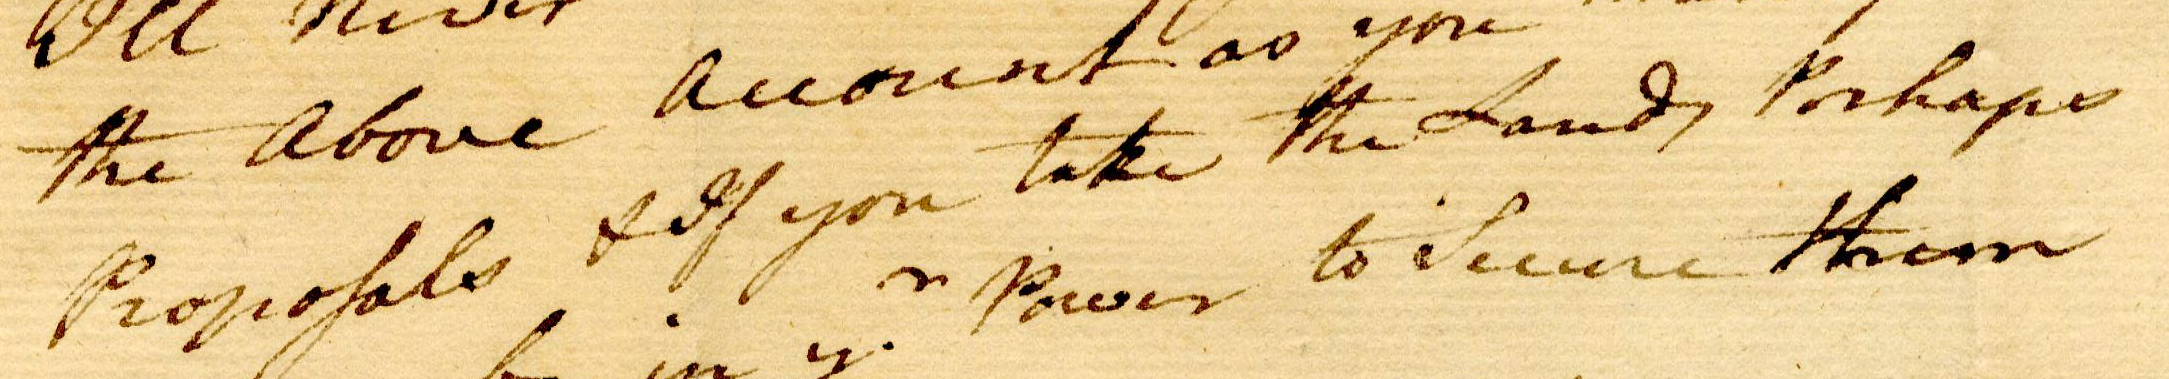Proposals & If you take the Land Perhaps
